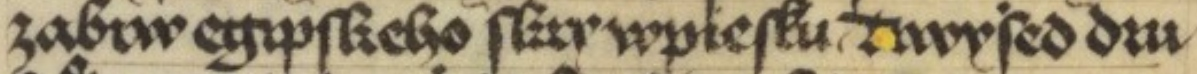zabiw egipſkeho ſkry wpieſku Awyẛed dru-
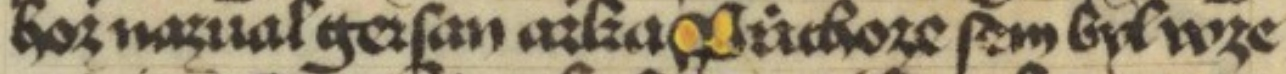hož nazual gerẛan aṙka Přichoze ẛem byl wze-
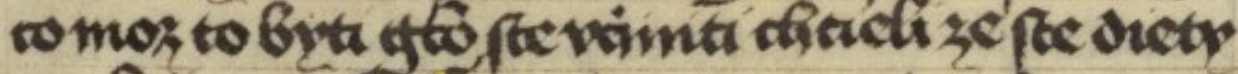co moz to byti g̑to ſte vċiniti chcieli ze ſte diety
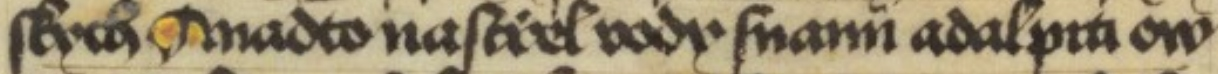ſkych Anadto naſtṙel vody ſnami adal piti ow-
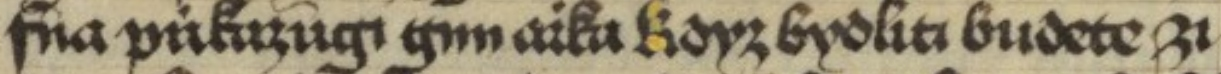fna pṙikazugi gim aṙka Kdyz bydliti budete zi-
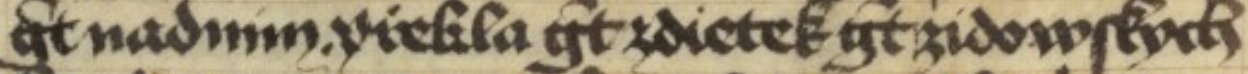g̑t nadnim.yṙekla g̑t zdietek g̑t żidowſkych
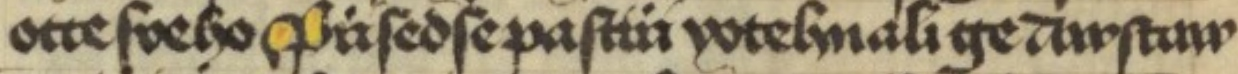otce ſveho Pṙiſedẛe paſtiṙi yotehnali ge awſtaw
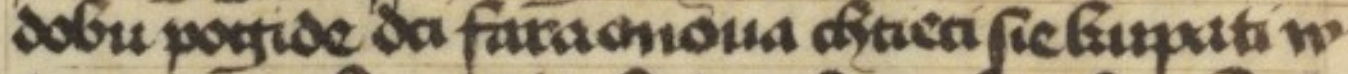dobu pogide da faraonoua chtieci ſie kupati w-
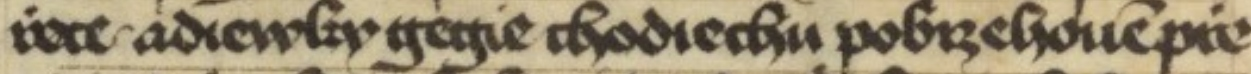ṙece adiewky gegie chodiechu pobrzehouȇ pṙe-
